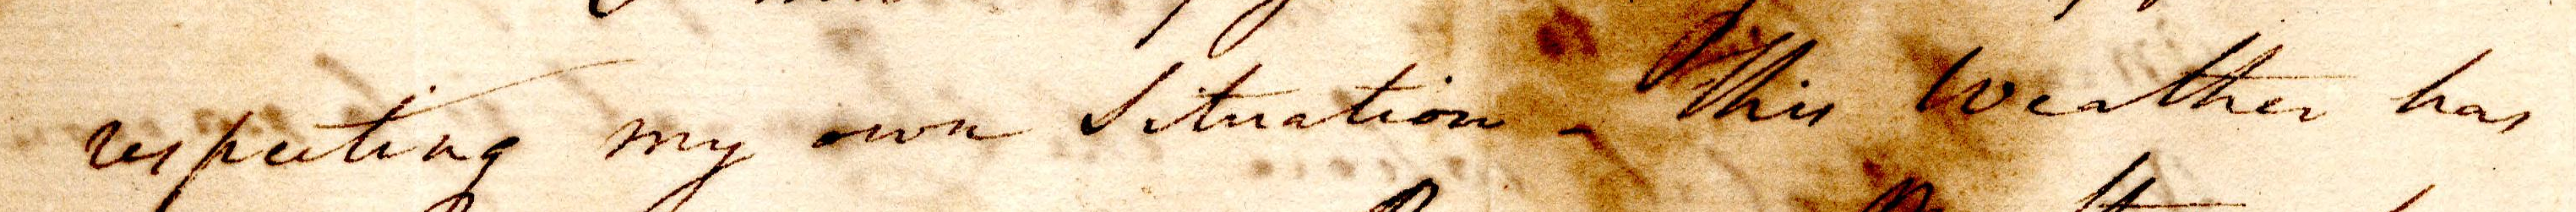respecting my own Situation this weather has
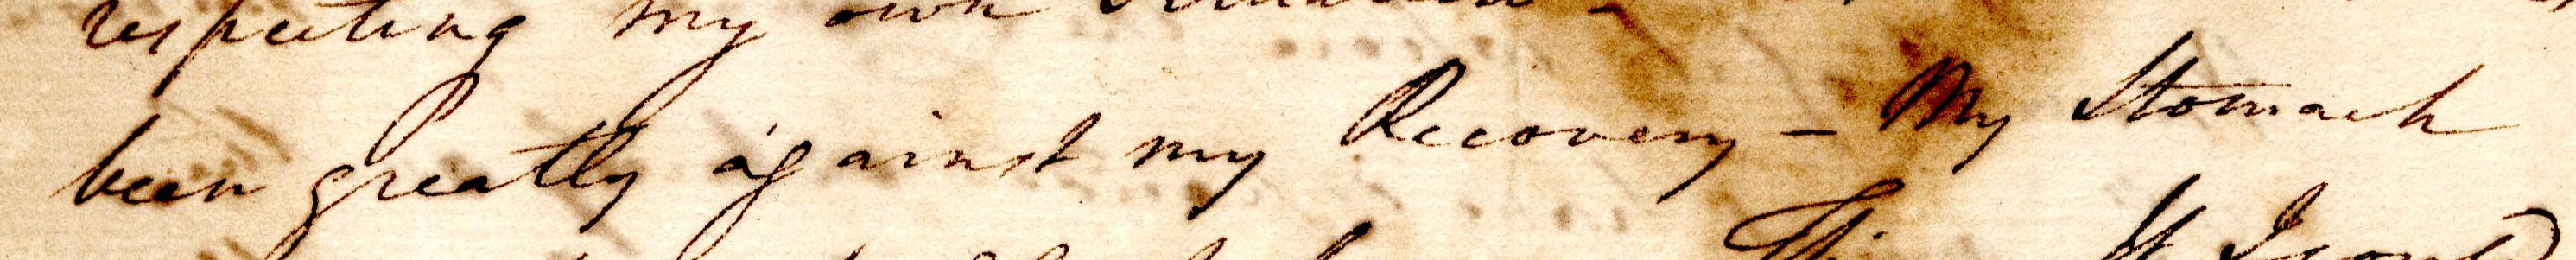been greatly against my Recovery- My Stomach
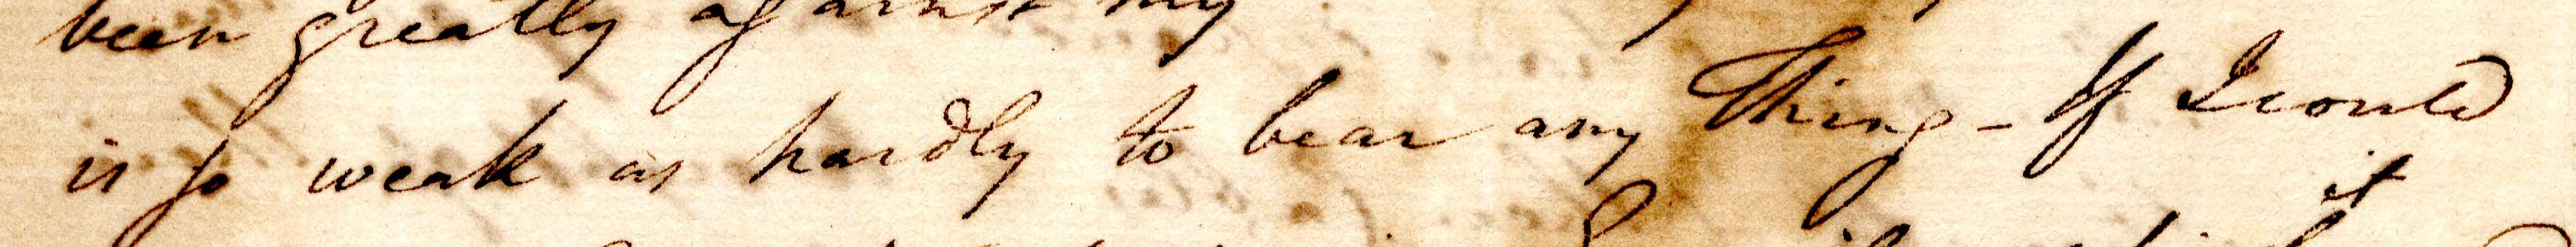is so weak as hardly to bear any Thing- If I could
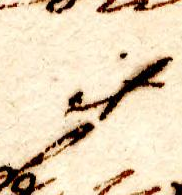it
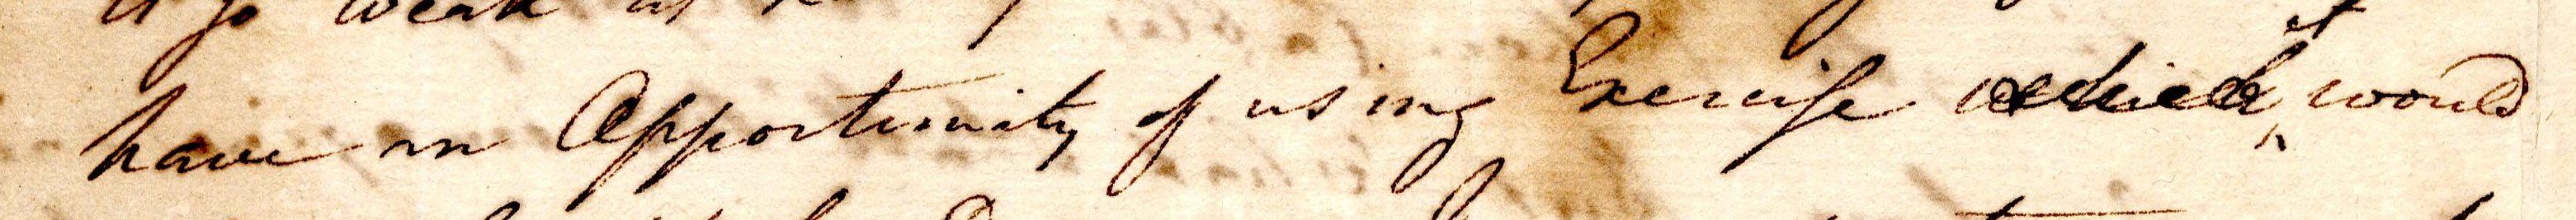have an Opportunity of using Exercise [_____] ^ would
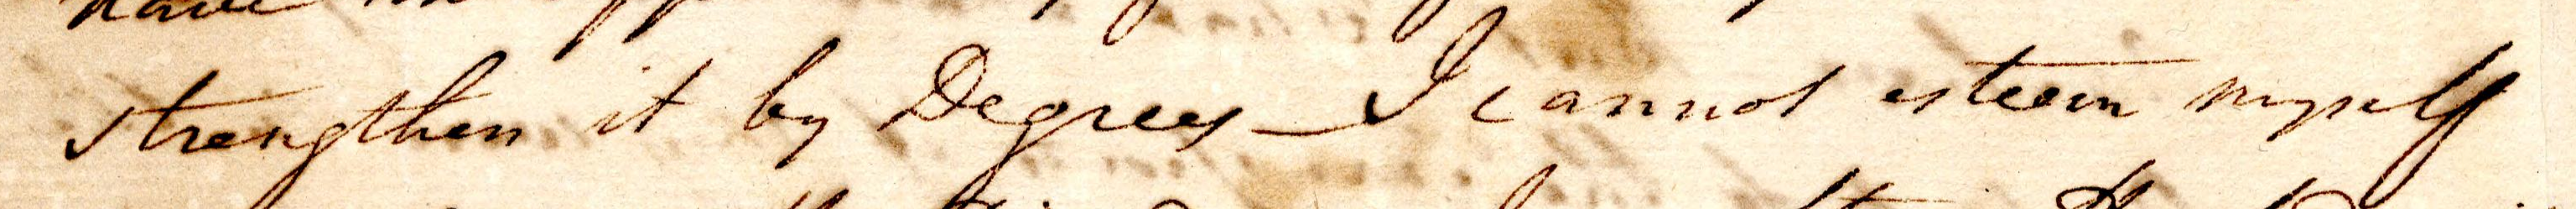strengthen it by Degrees- I cannot esteem myself
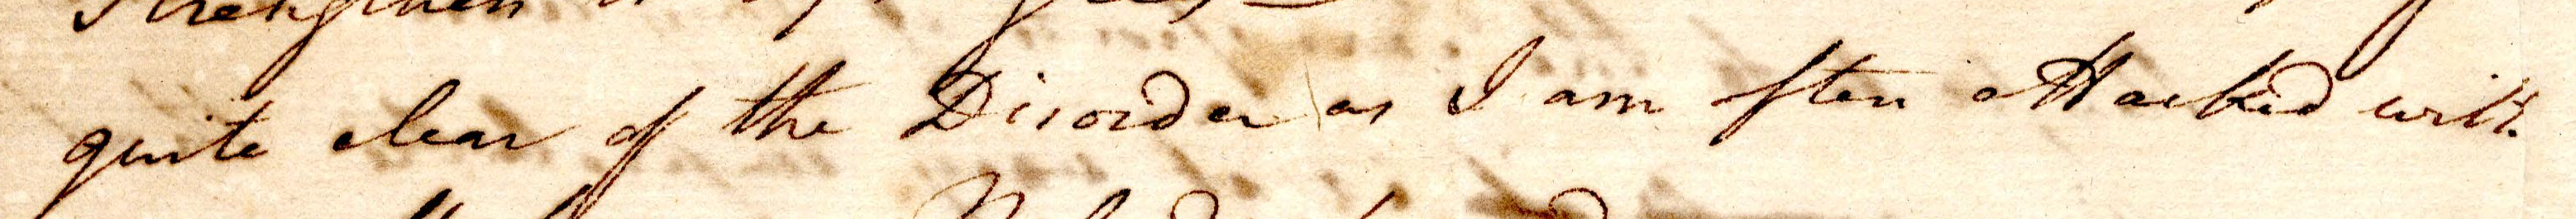quite clear of the Disorder as I am after attacked with
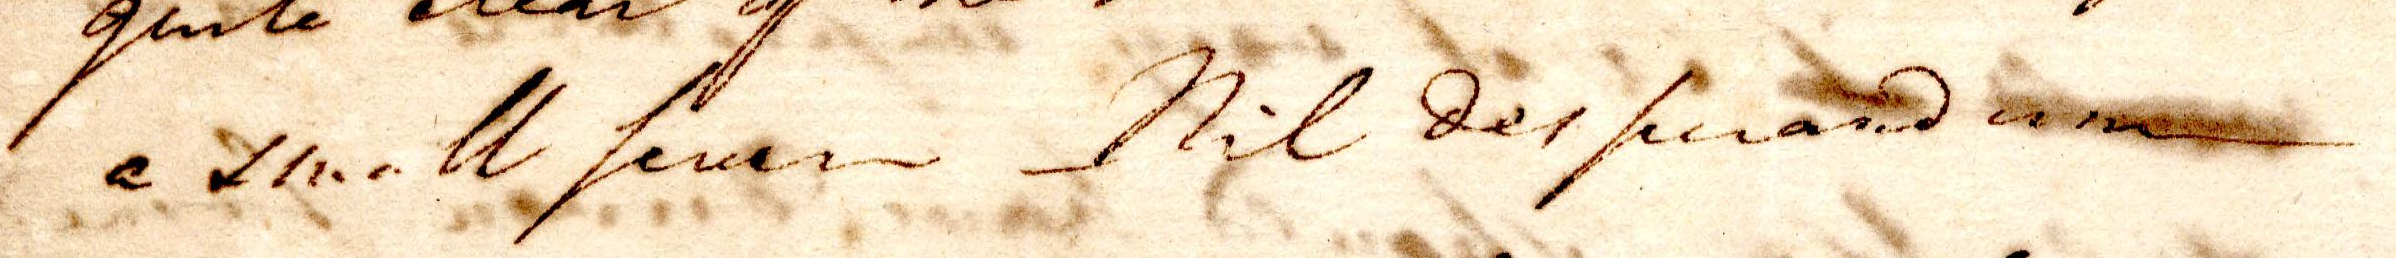a small fever- Nil desperandum-
